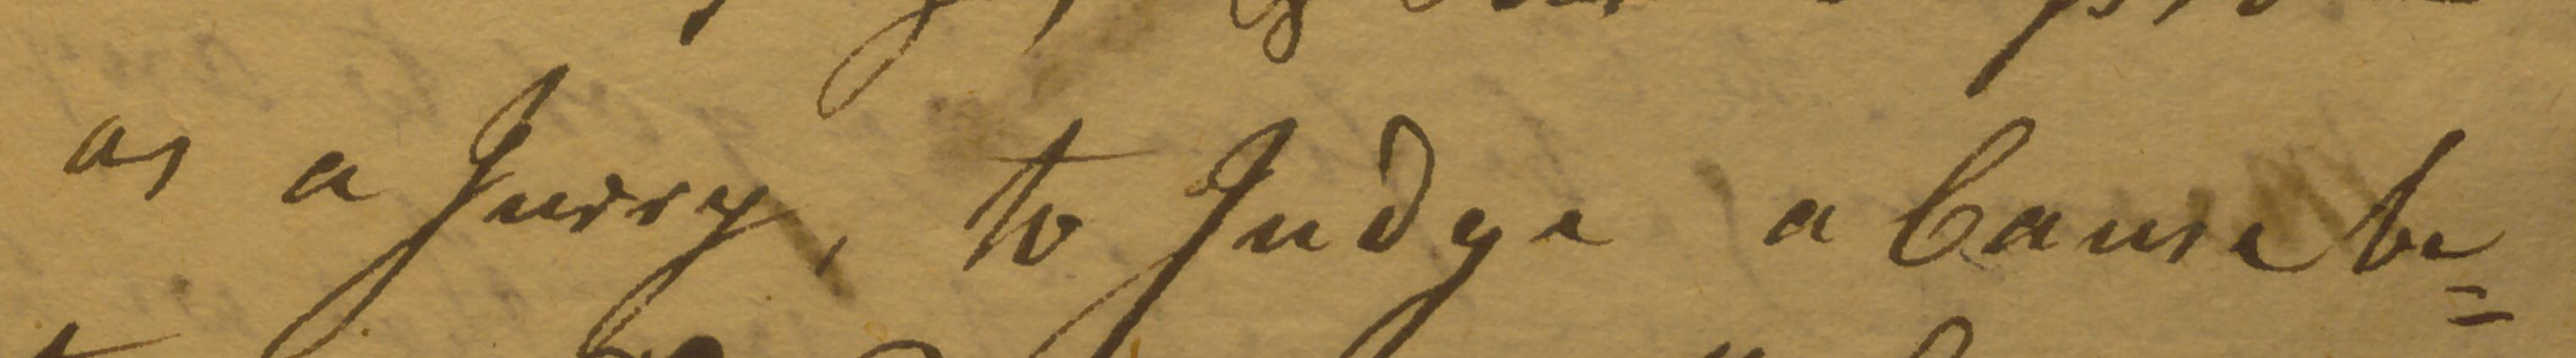as a Jurry, to Judge a Cause be
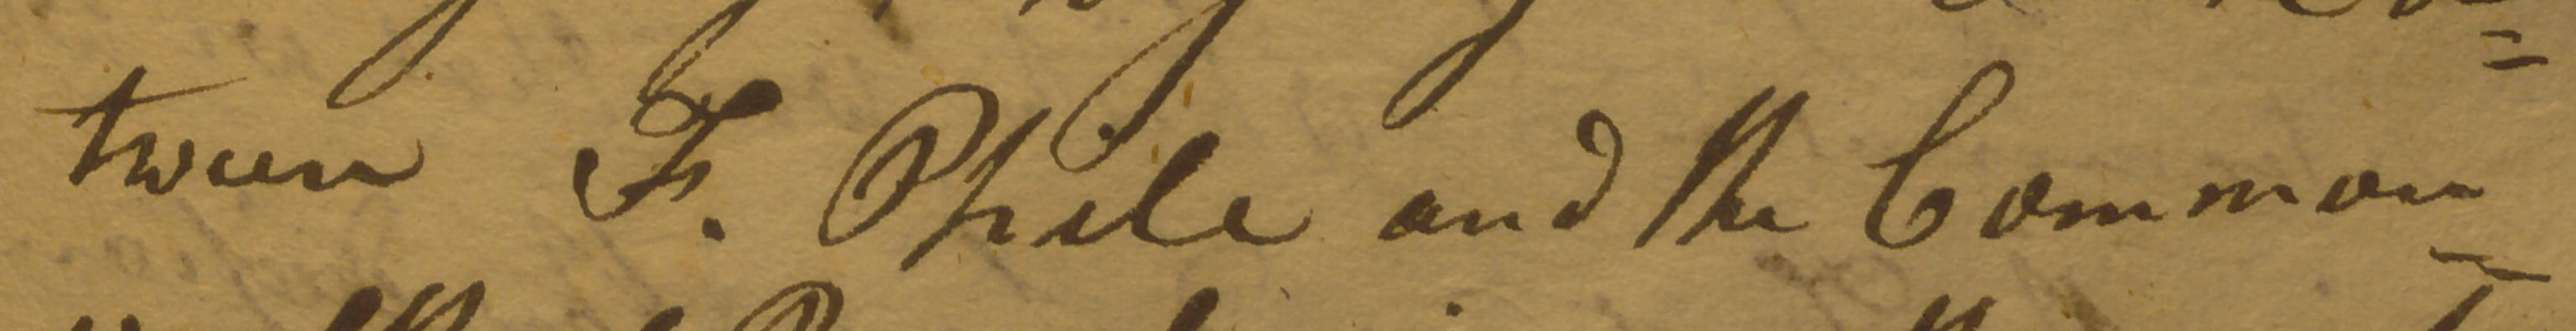tween F. Phile and the Common
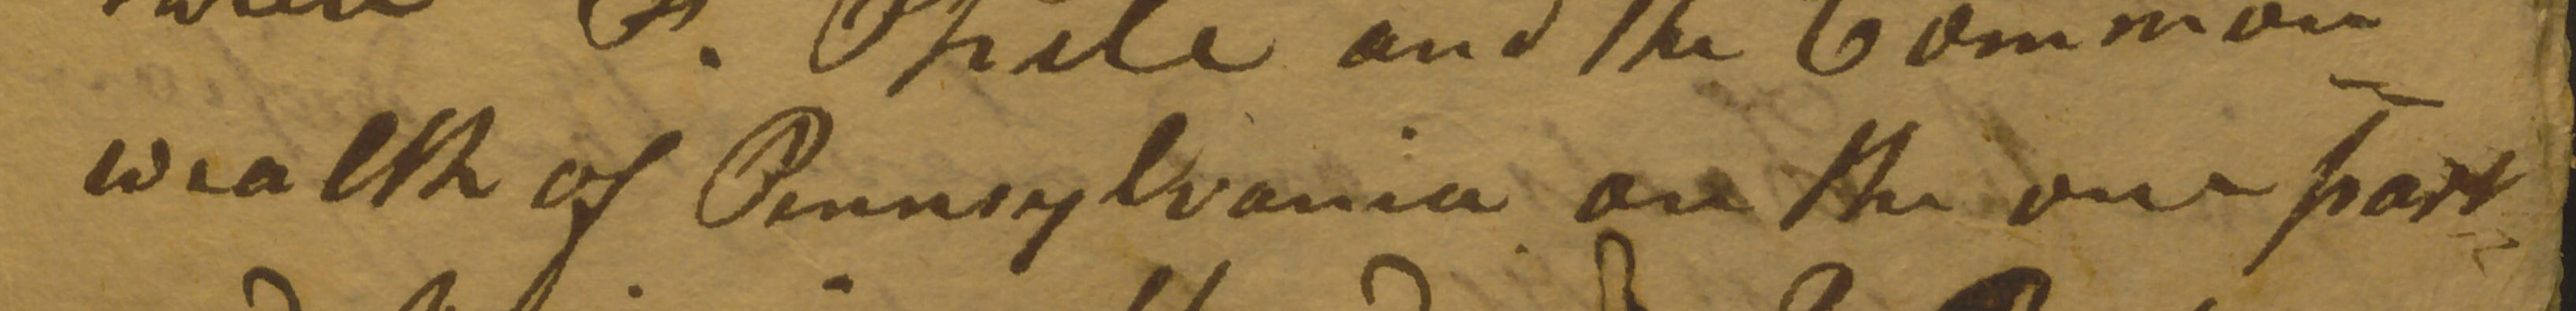wealth of Pennsylvania an the one part
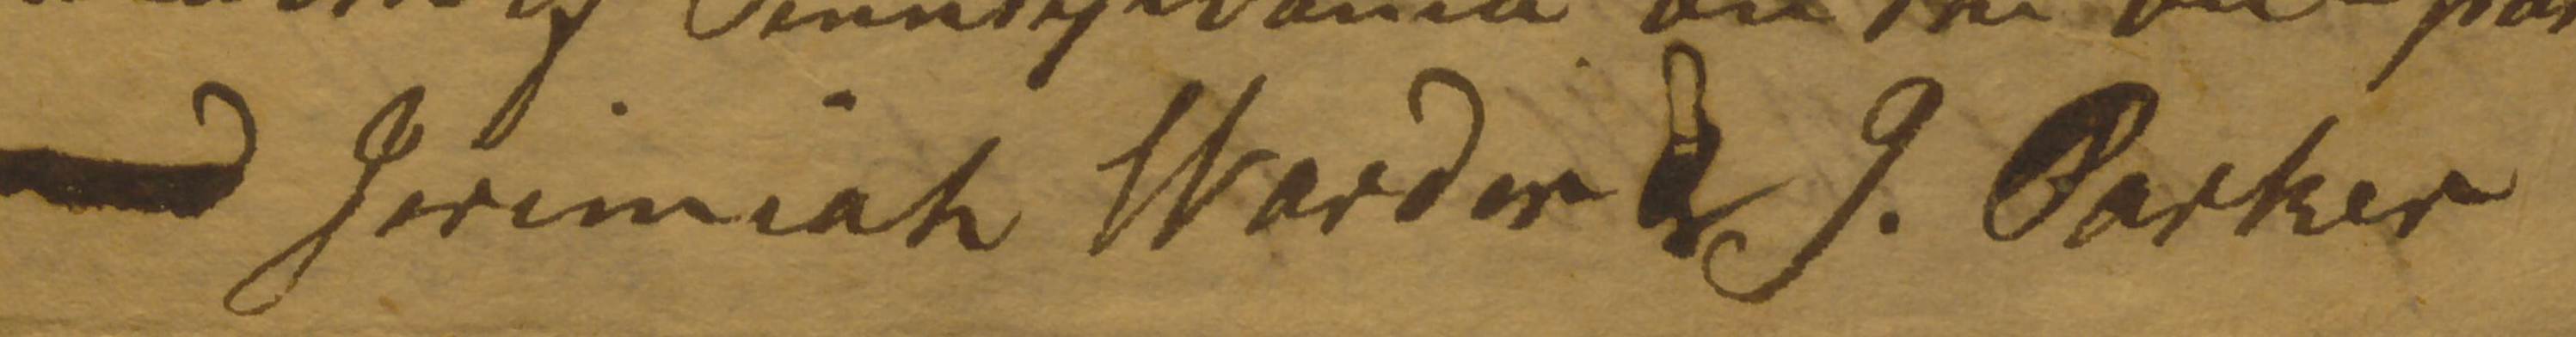Jeremiah Warder & J. Parker
